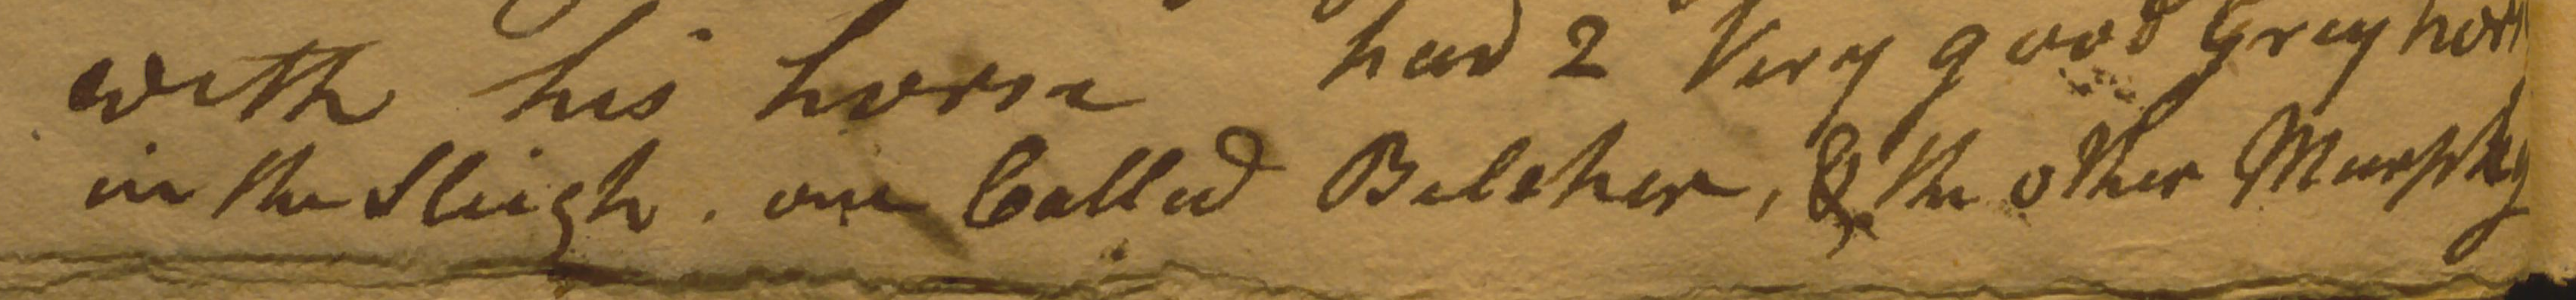in the Sleigh, one Called Belcher, & the other Murphy
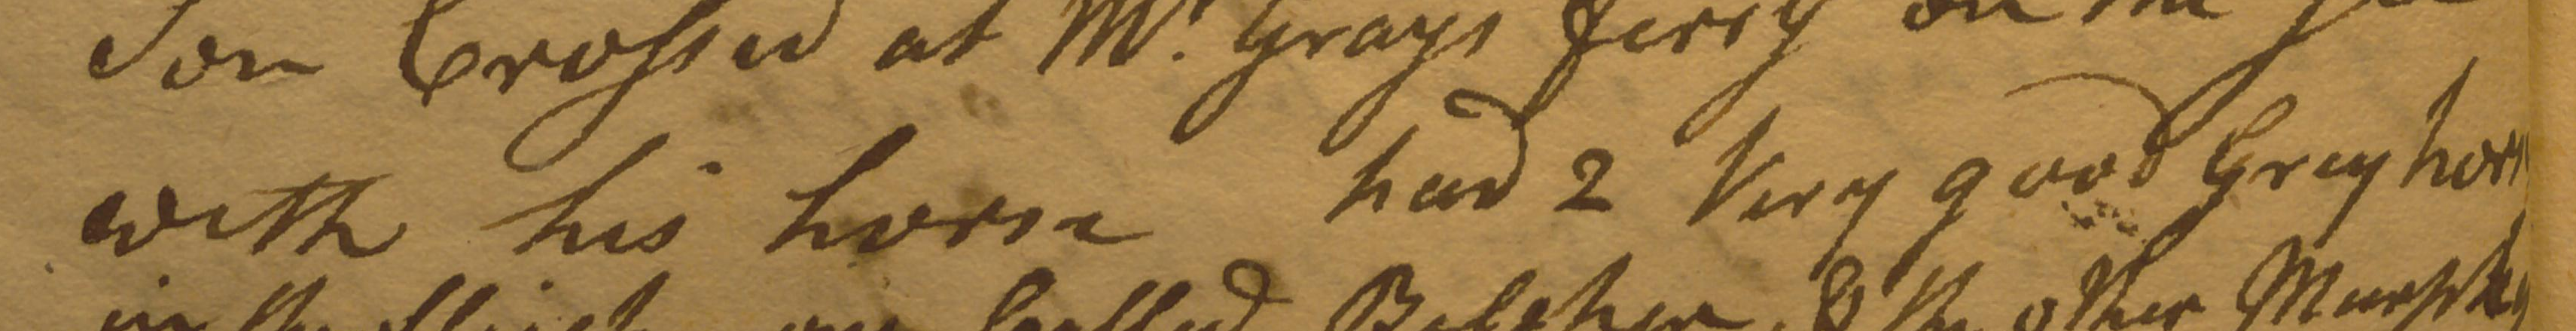with his horse had 2 Very gaod Greyhors
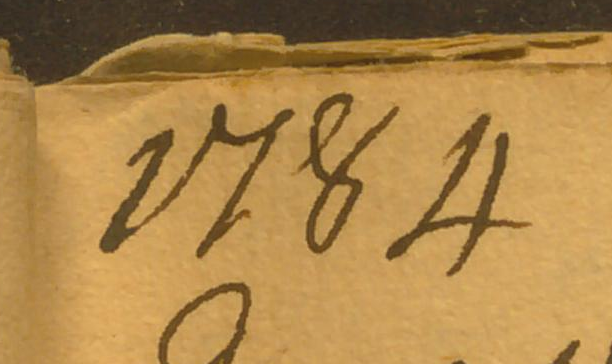1784
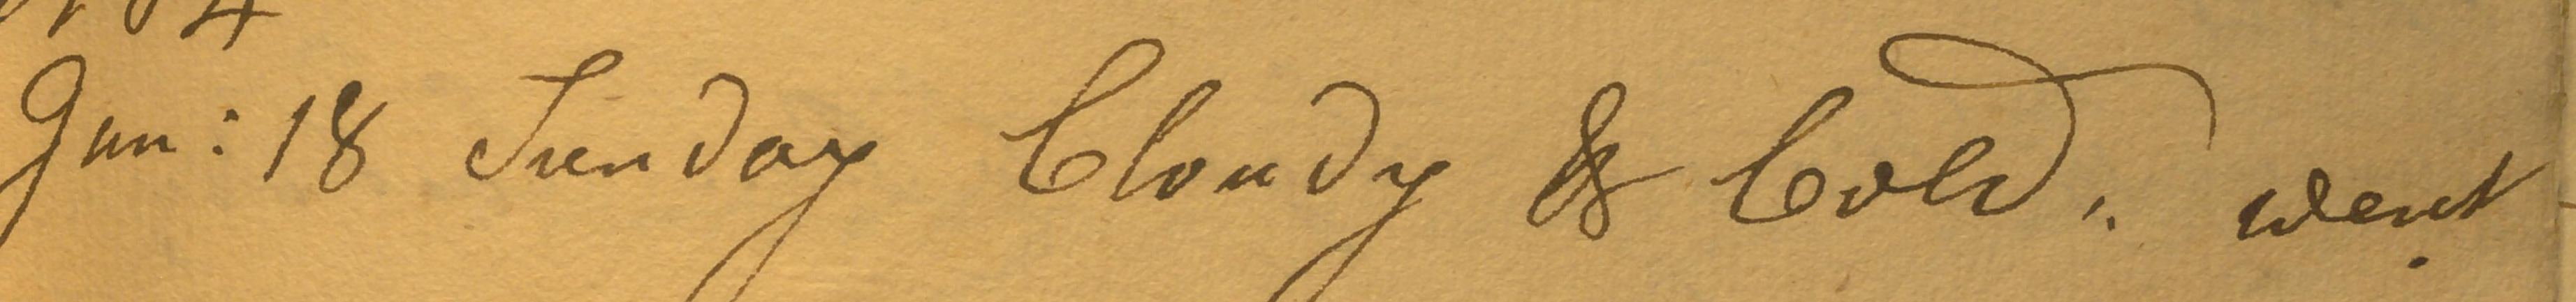Jan: 18 Sunday Cloudy & Cold. went
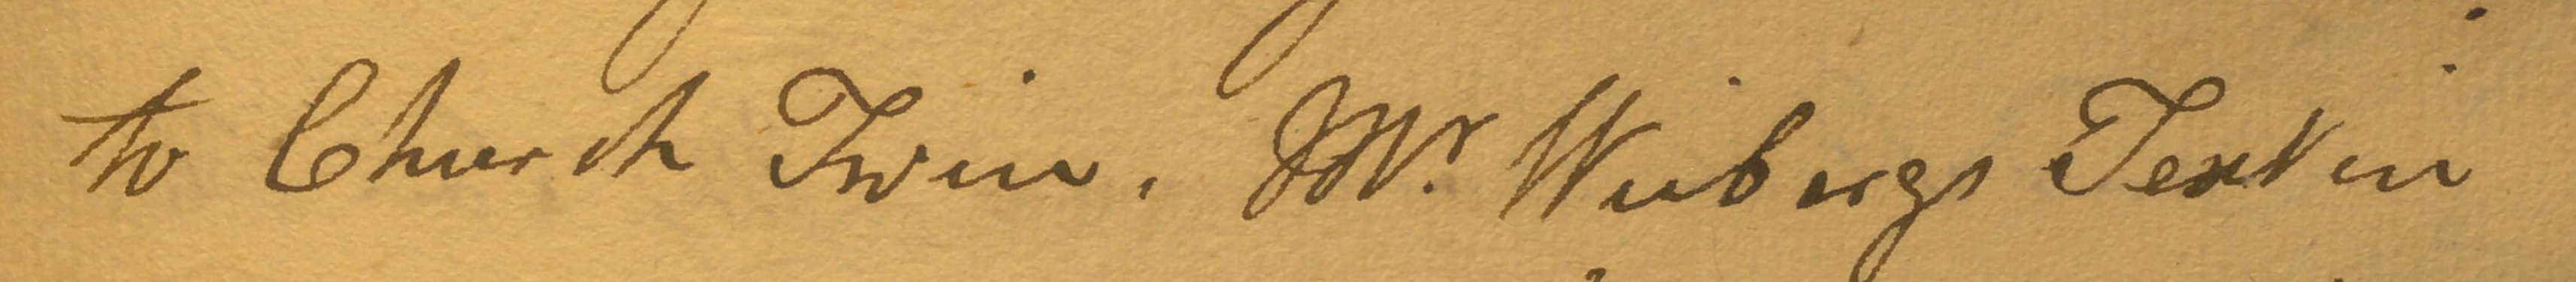to Church Twice. M^r. Weibergs Text in
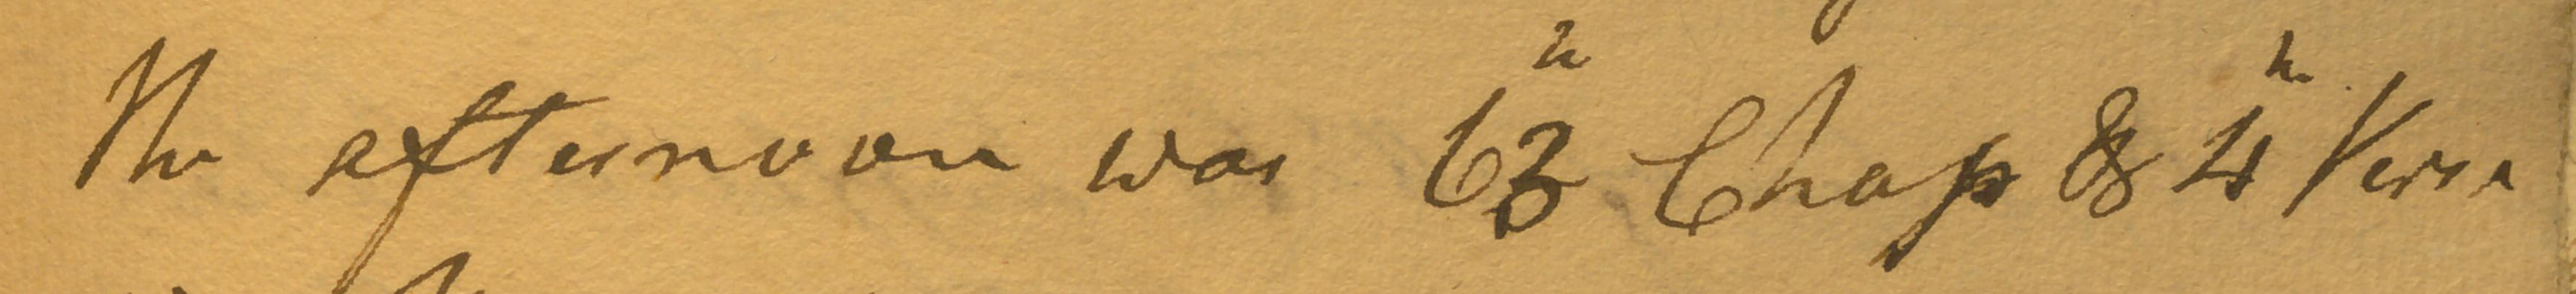the afternoon was 63^h Chap & 4^h Verse
